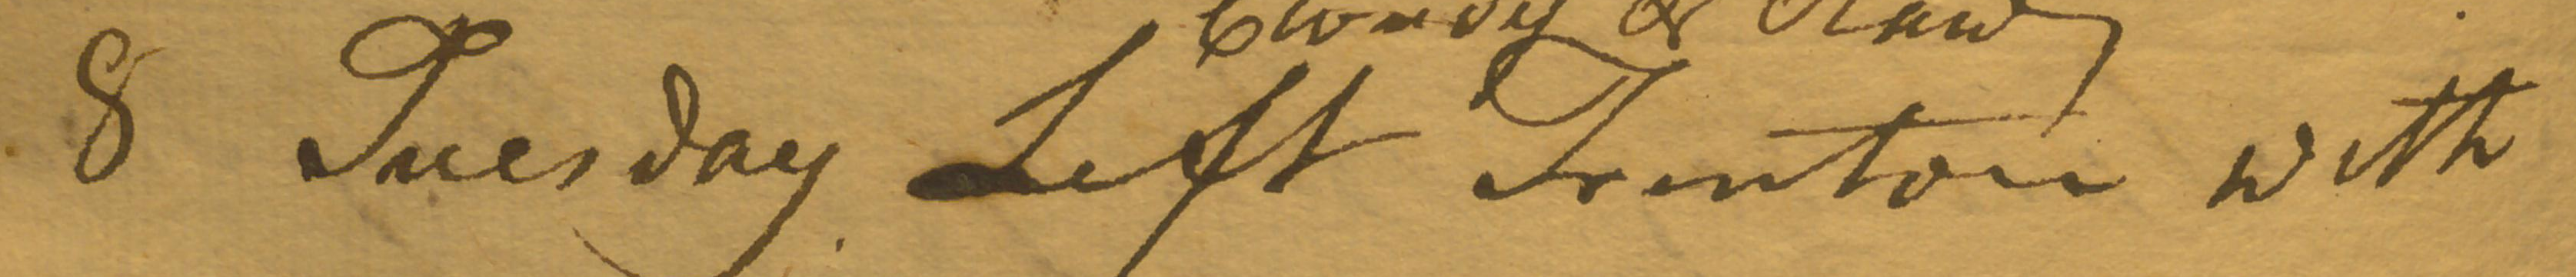8 Tuesday Left Trenton with
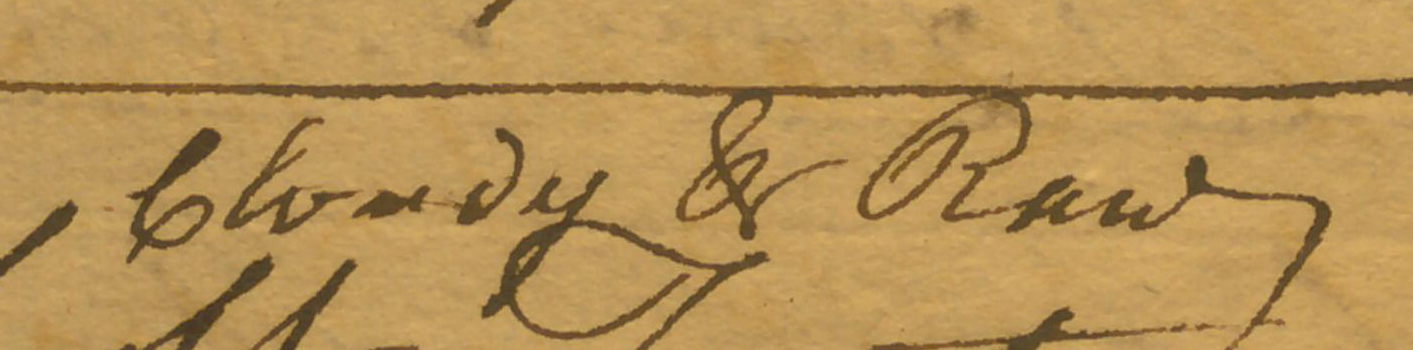Cloudy & Raw
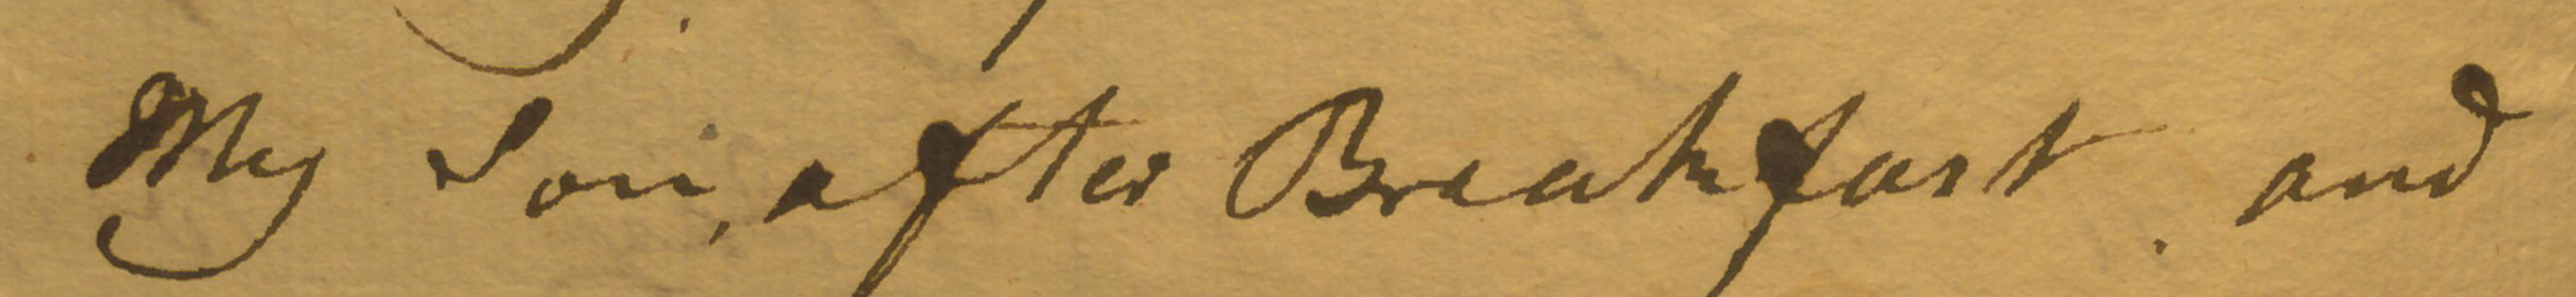My son after Beakfast and
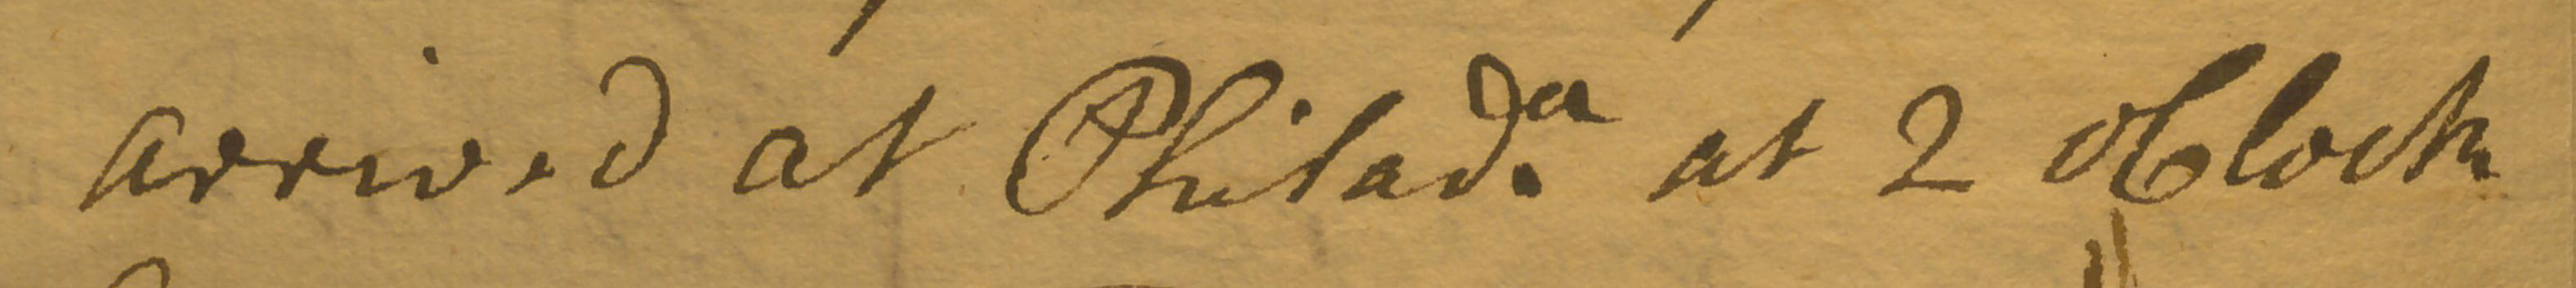arrived at Philad^a. at 2 oClock
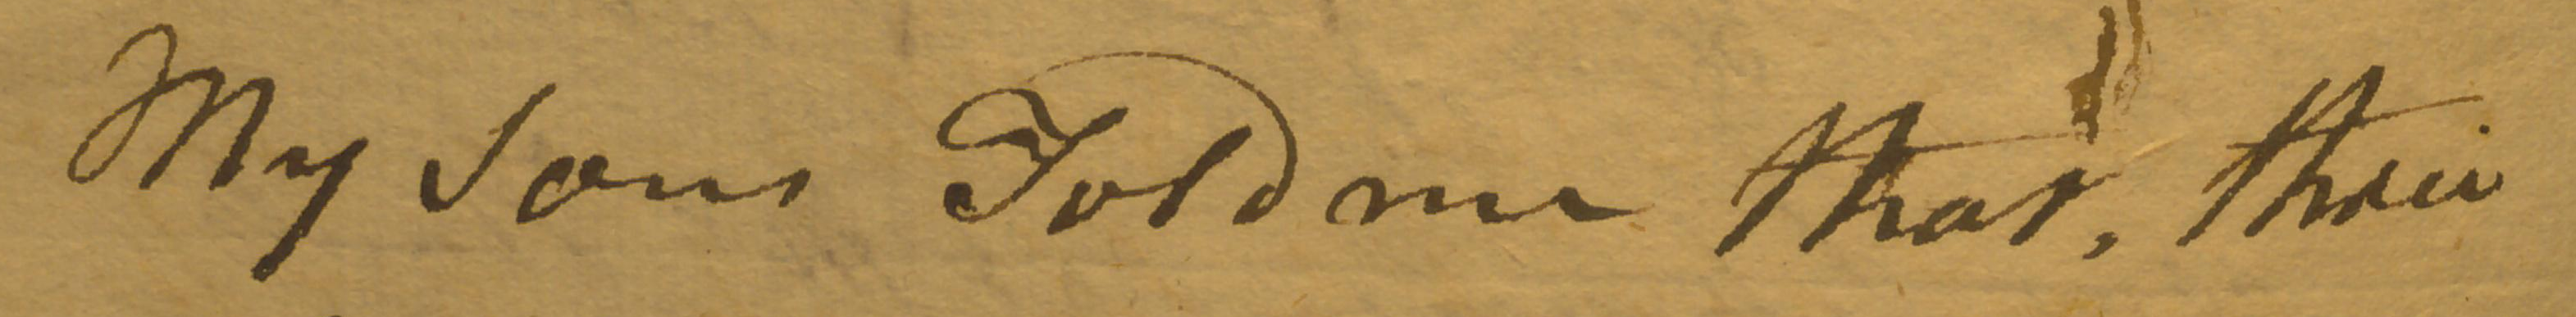My Sons Told me that three
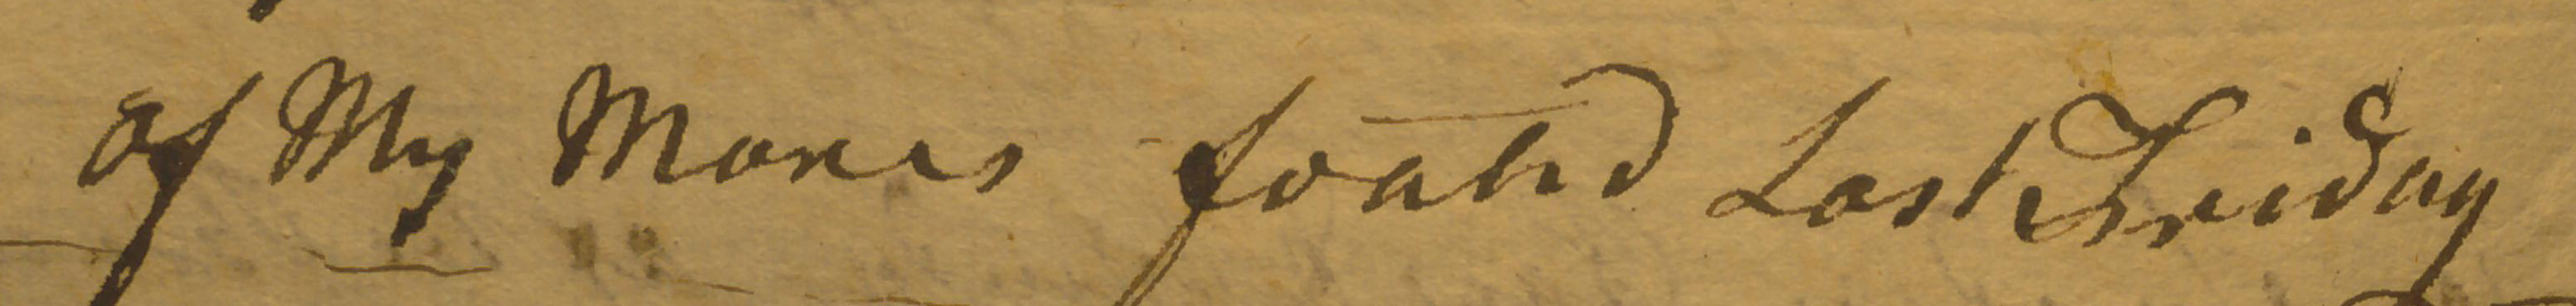of My Mones foaled Last Friday
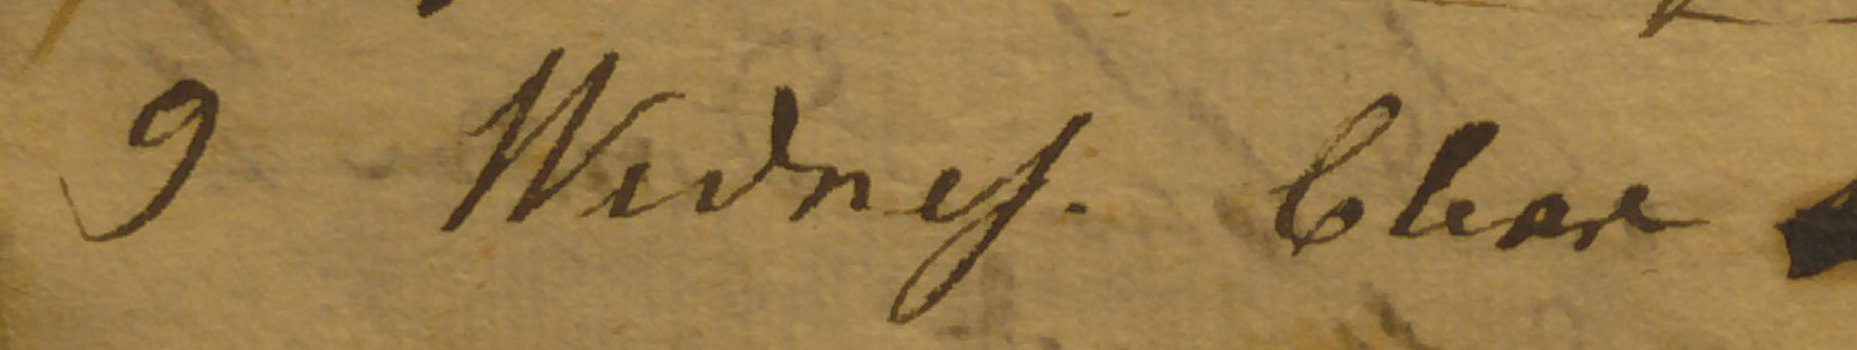9 Wednes. Clear
